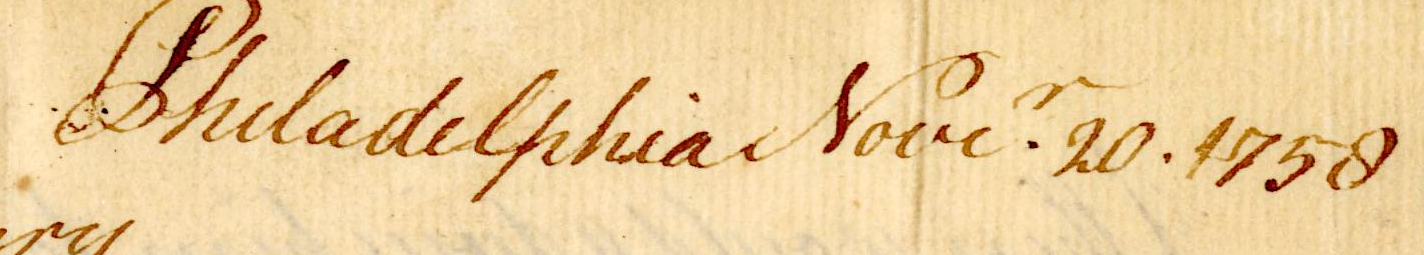Philadelphia Nove^r 20 1758
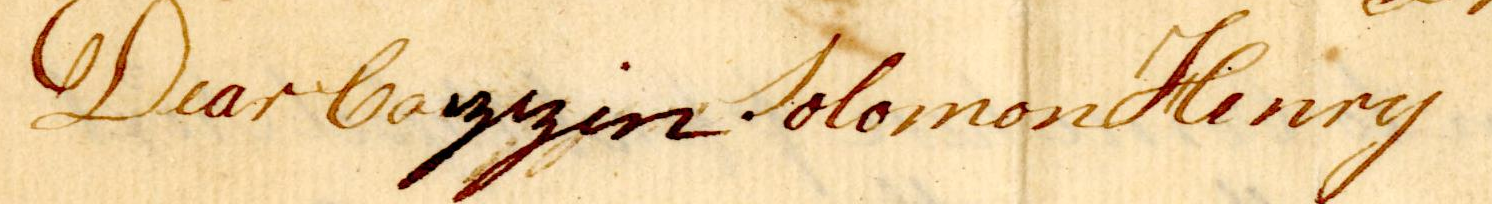Dear Cazzin Solomon Henry
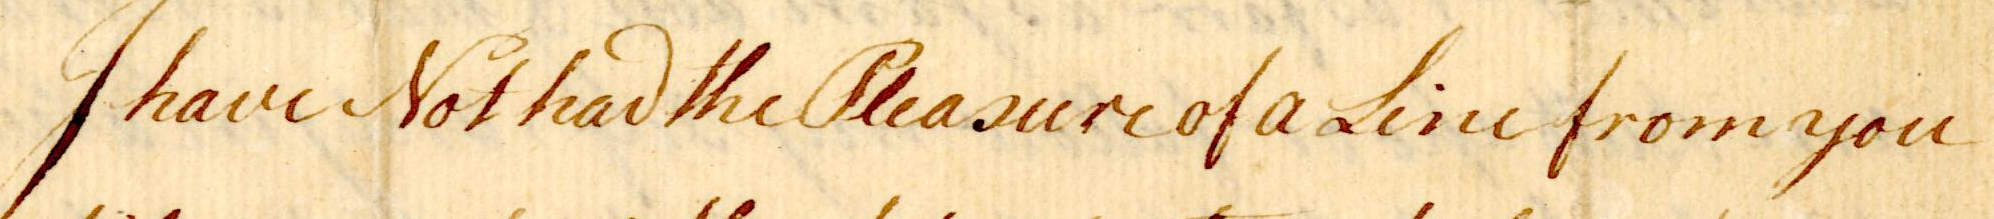I have Not had the Pleasure of a Line from you
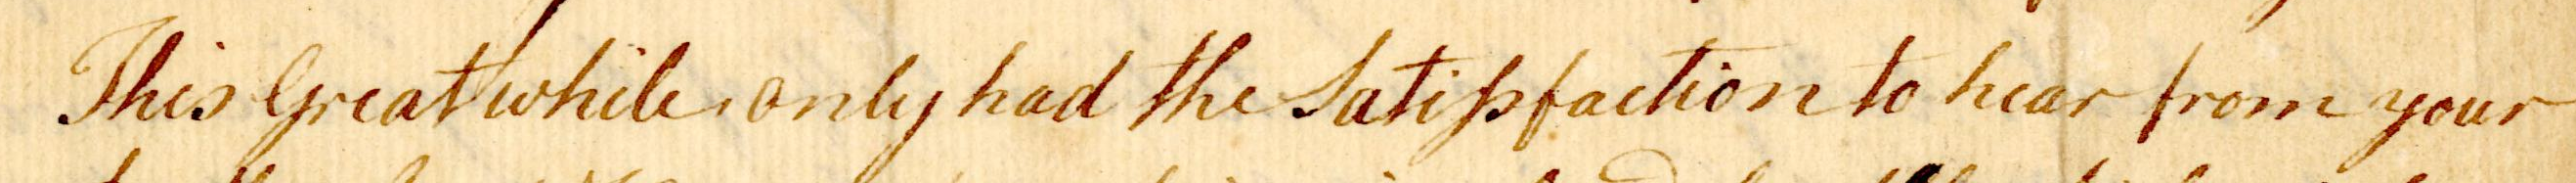This Great while only had the Satisfaction to hear from your
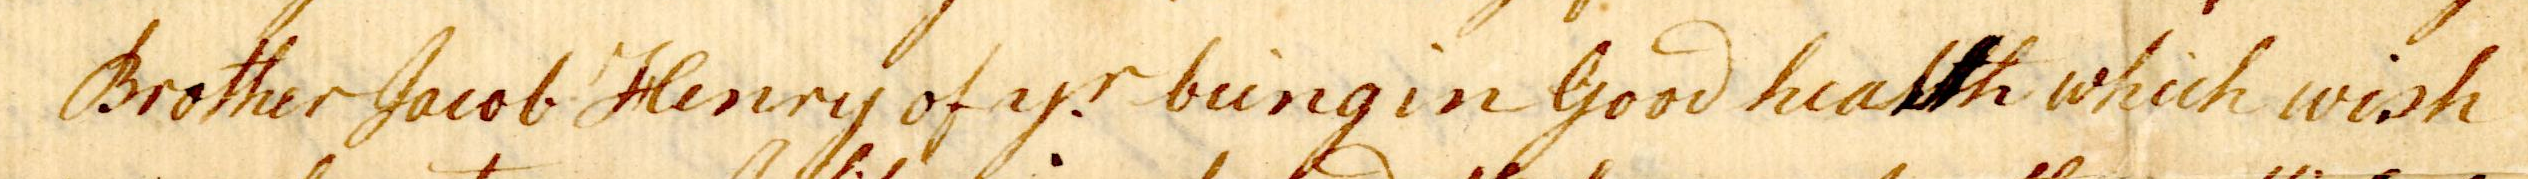Brother Jacob Henry of y^r. being in Good health which wish
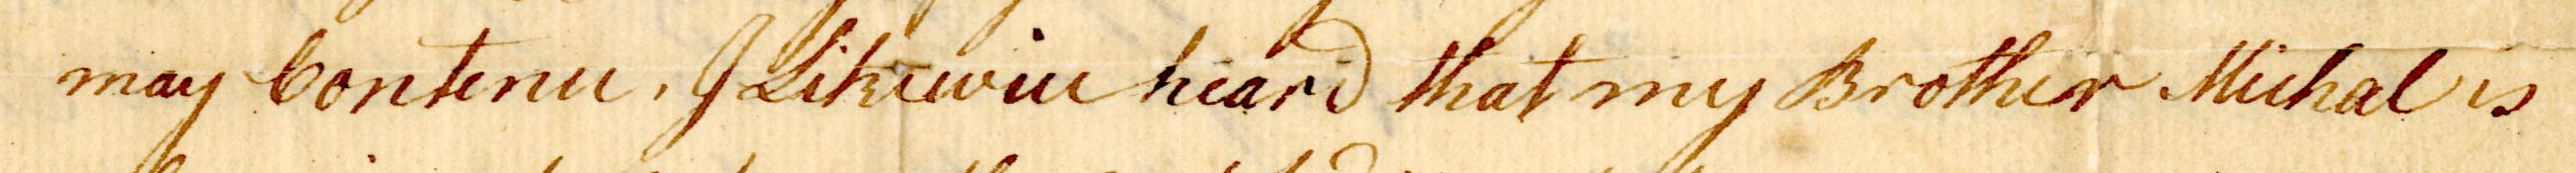may Continue I Likewise heard that my Brother Michal is
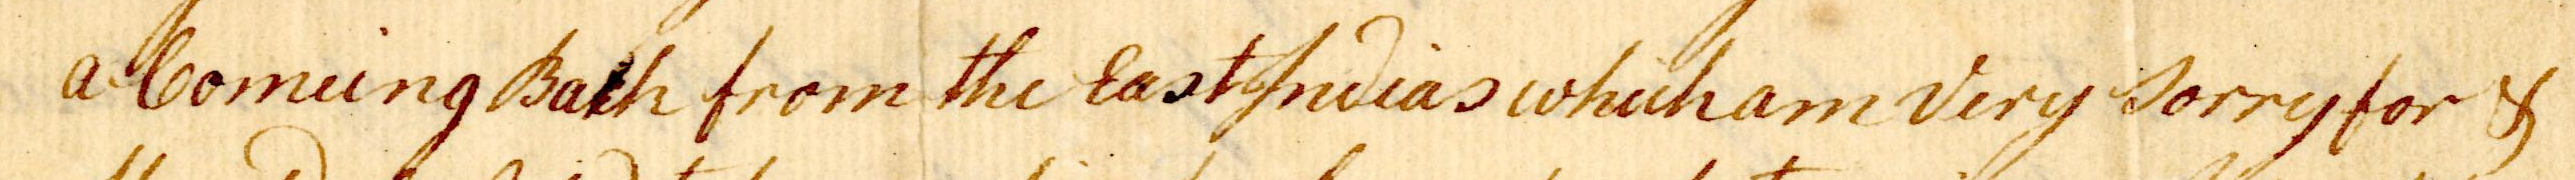a Comeing Back from the East Indias which am very sorry for &
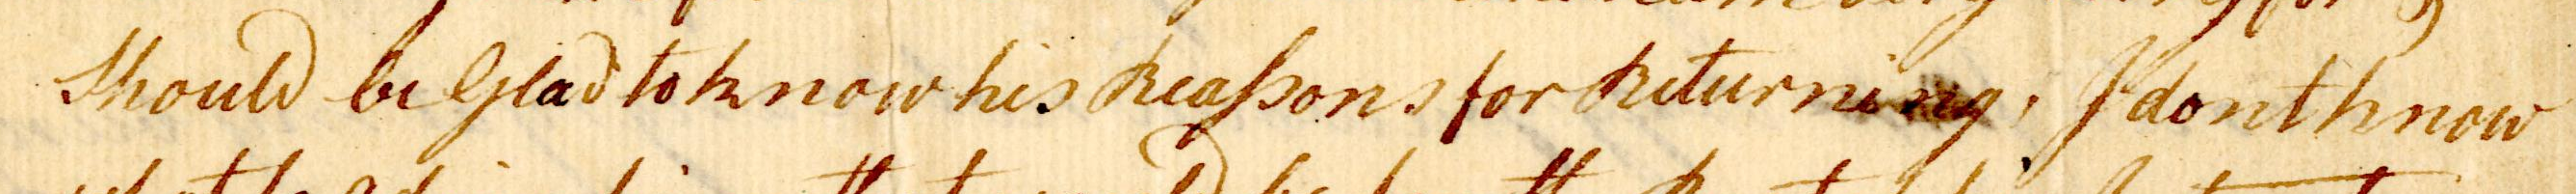should be Glad to know his Reasons for Returning, I dont know
